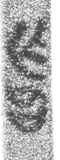囂
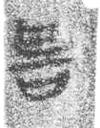○（始）
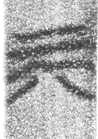而
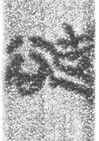欲
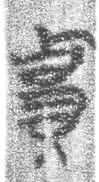貴
